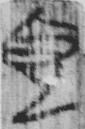見
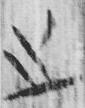之
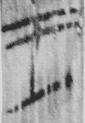王
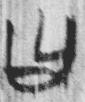曰
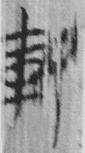○（范）
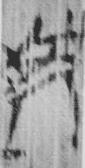乘
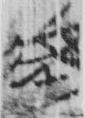○（吾）
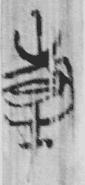幹（安）
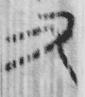又（有）
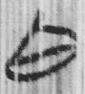白
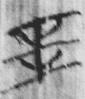玉
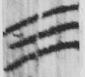三
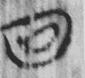回
